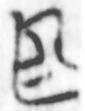耴
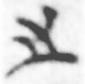之
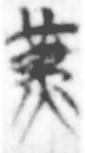黃
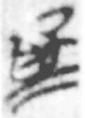爲
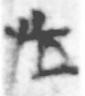○（左）
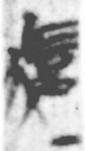驂
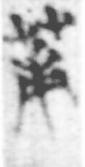莆
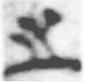之
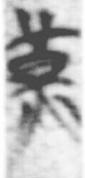黃
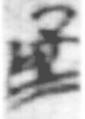爲
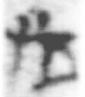○（左）
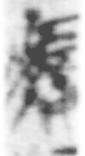○（服）
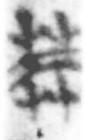𣗥（束）
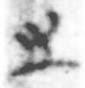之
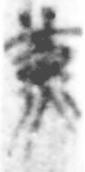黃
